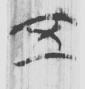五
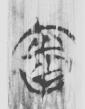審
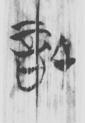信
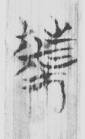{艸㡀}
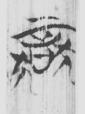獄
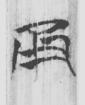甬
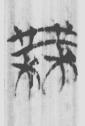無
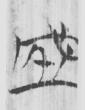城
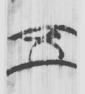五
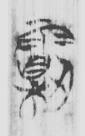{雨臬刀}
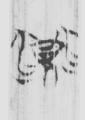{水貝水}
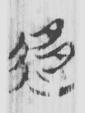迻
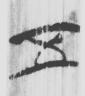五
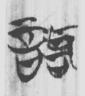詒
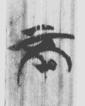不
